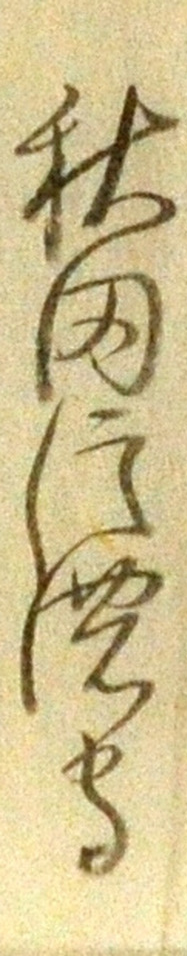秋田信濃守
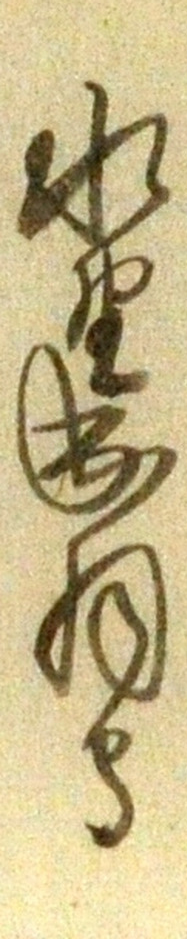水野出羽守
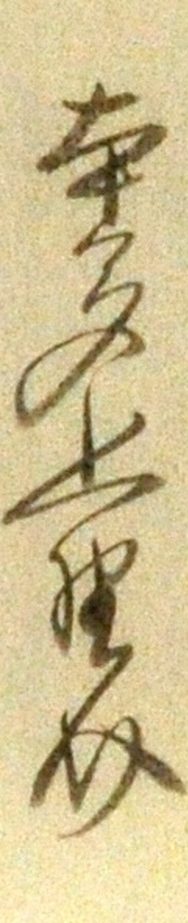本多上総介
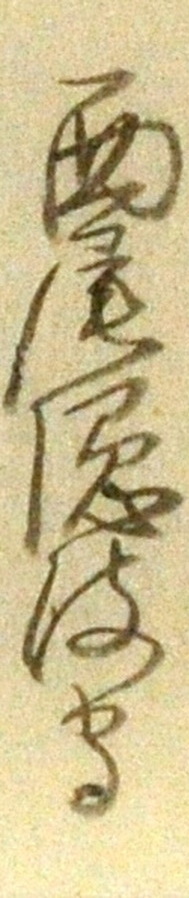煩西尾隠岐守
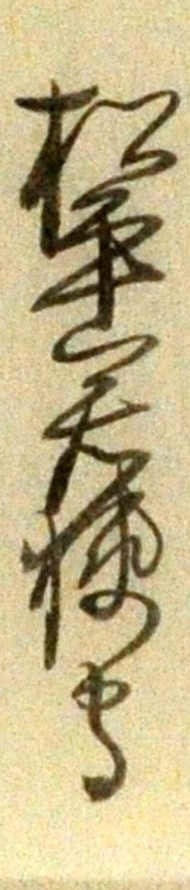松平若狭守
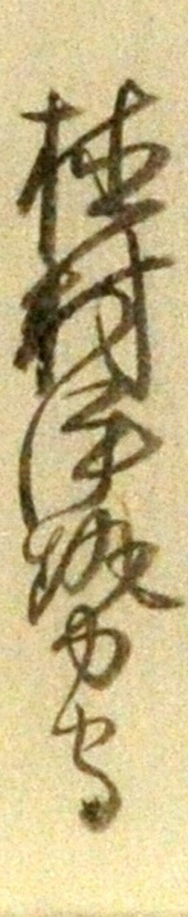植村伊勢守

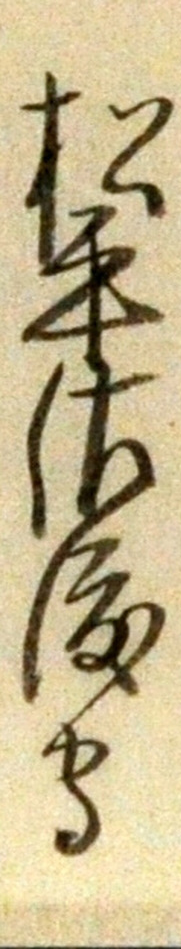松平佐渡守
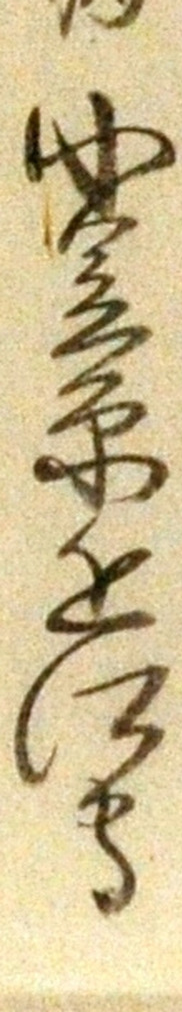長病小笠原近江守
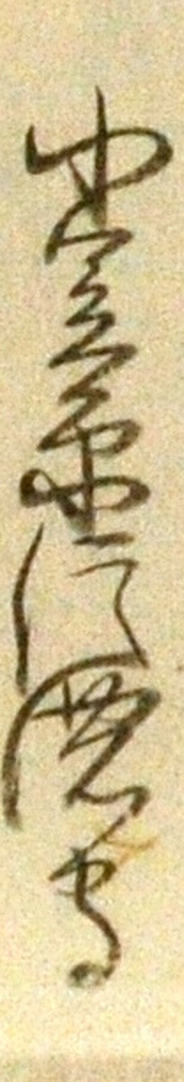小笠原信濃守
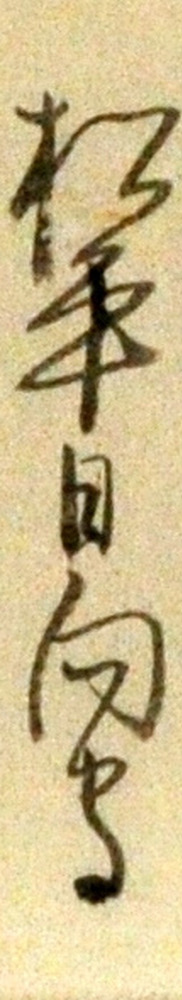松平日向守
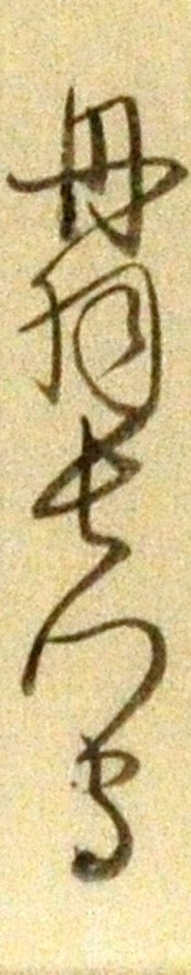丹羽長門守
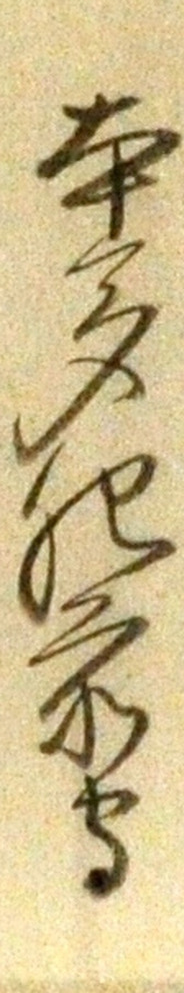本多肥前守
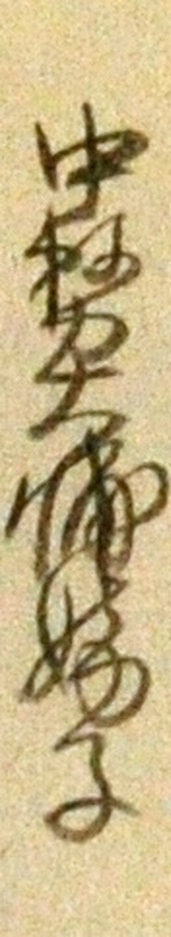中務大輔嫡子
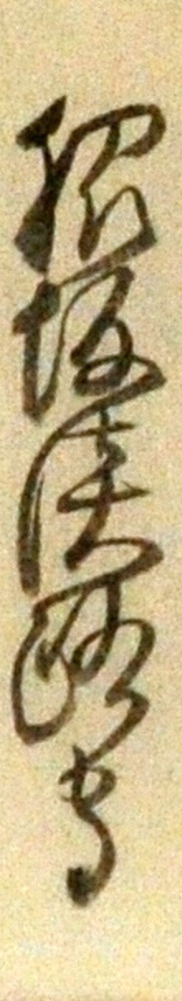脇坂淡路守
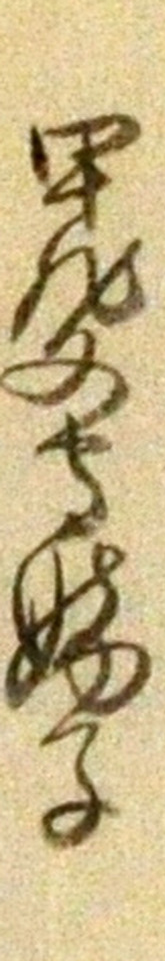甲斐守嫡子
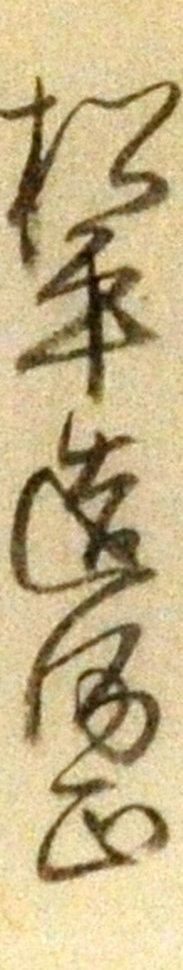松平造酒正
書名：御馳走御能ノ節ノ留外
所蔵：伊那市立高遠町図書館・合同会社AMANE
